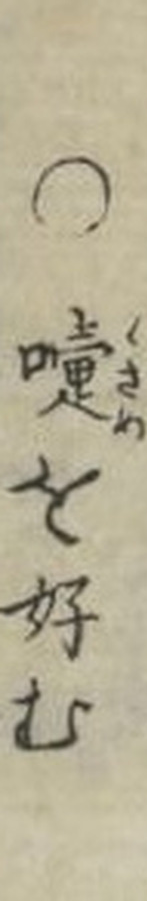○嚏を好む
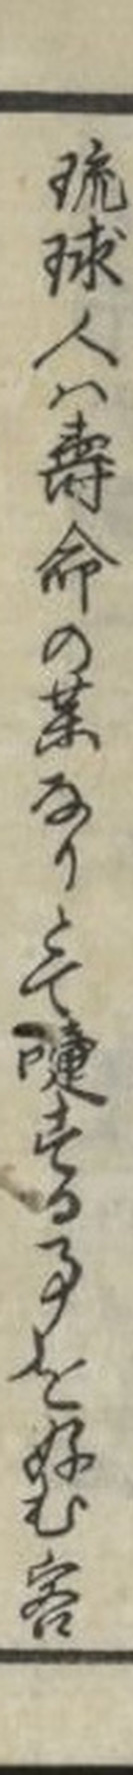琉球人は寿命の薬なりとて嚏する事を好む客

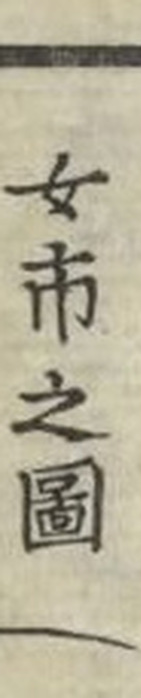女市之図

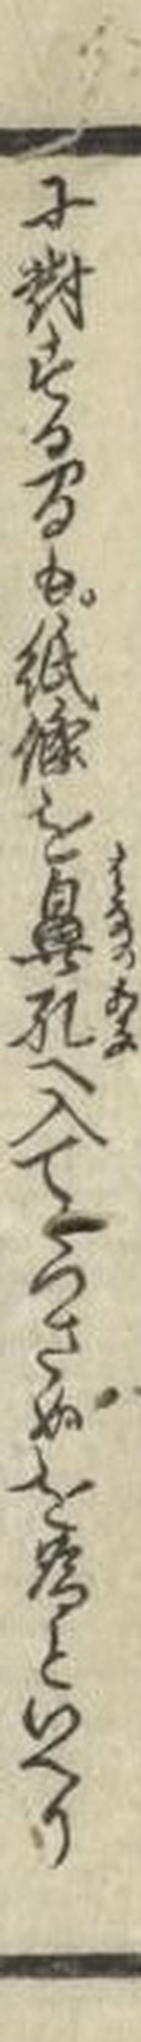に対する間も。紙条を鼻孔へ入てくつさめを為といへり
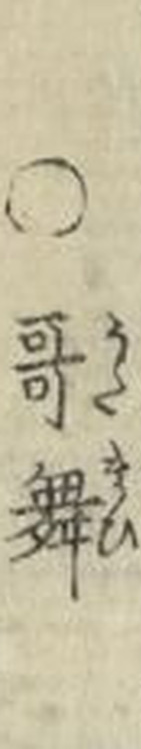○哥舞
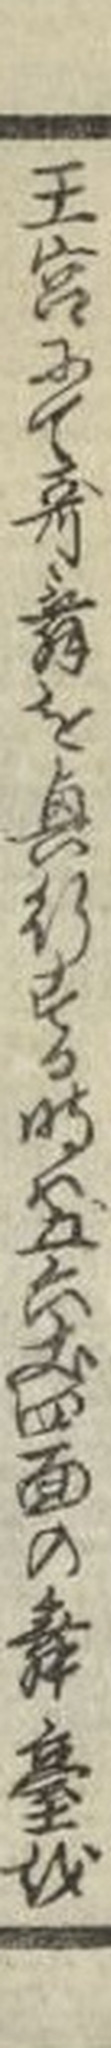王宮にて哥舞を興行する時は五六丈四面の舞台を
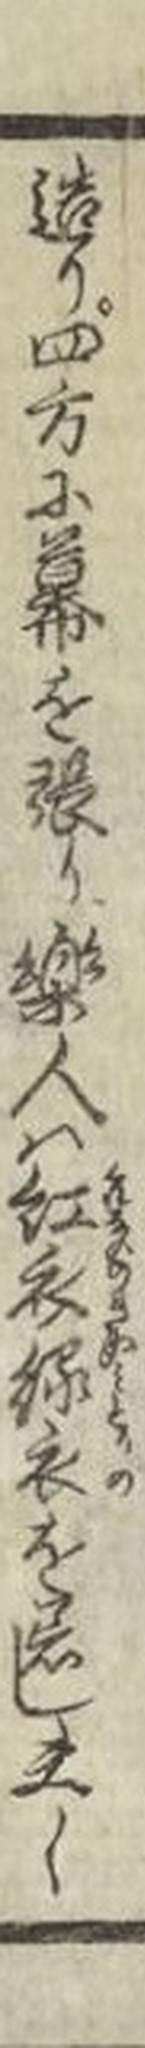造り。四方に幕を張り。楽人は紅衣緑衣を着し夫〳〵
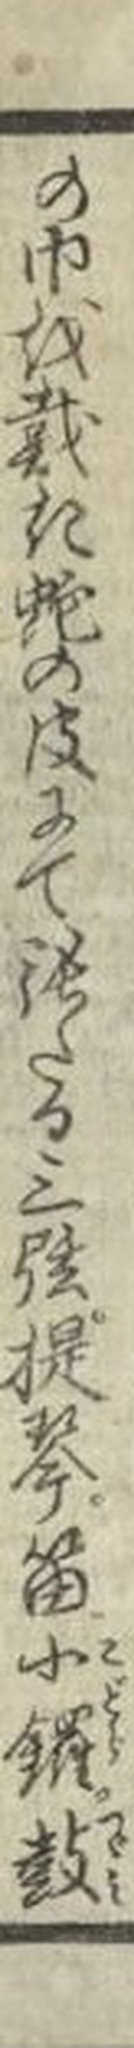の巾を戴き蛇の皮にて張たる三弦。提琴。笛小鑼。鼓
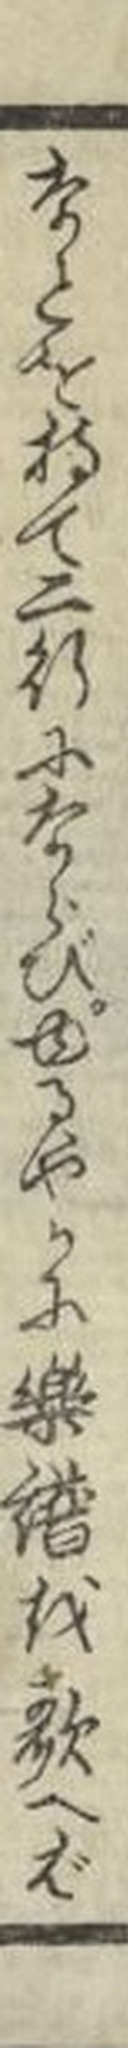なとを持て二行にならび。ゆるやかに楽譜を歌へば
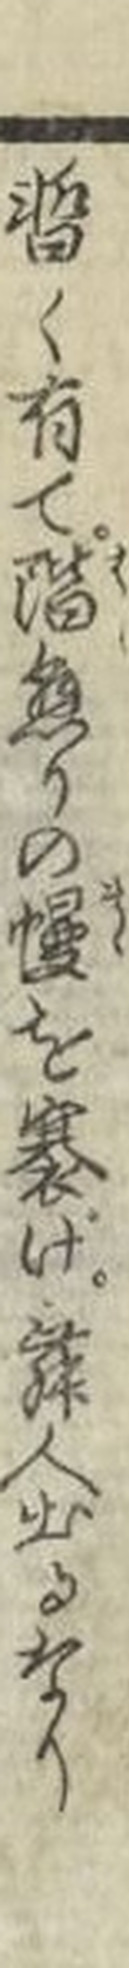暫く有て。階懸りの幔を褰げ。舞人出るなり
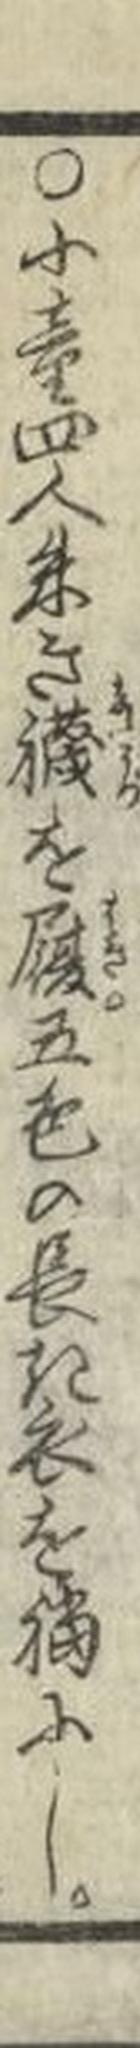○小童四人朱き襪を履。五色の長き衣を襠にし。
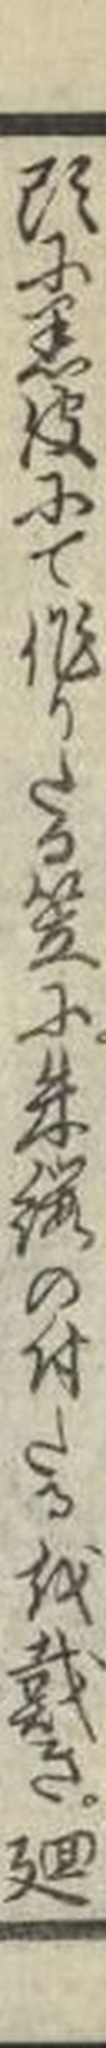頭に黒皮にて作りたる笠に。朱纓の付たるを戴き。廻
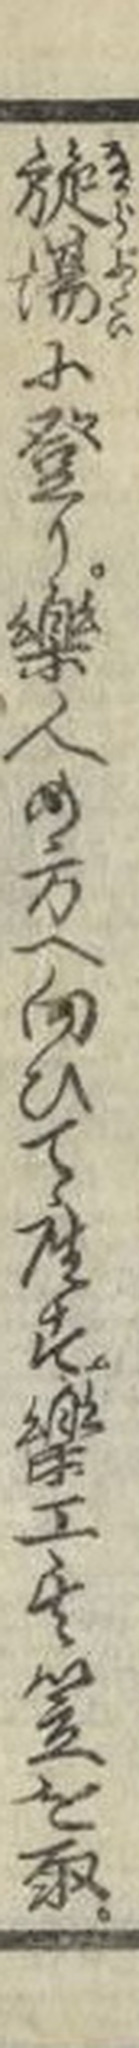旋場に登り。楽人の方へ向ひて座す。楽工其笠を取。
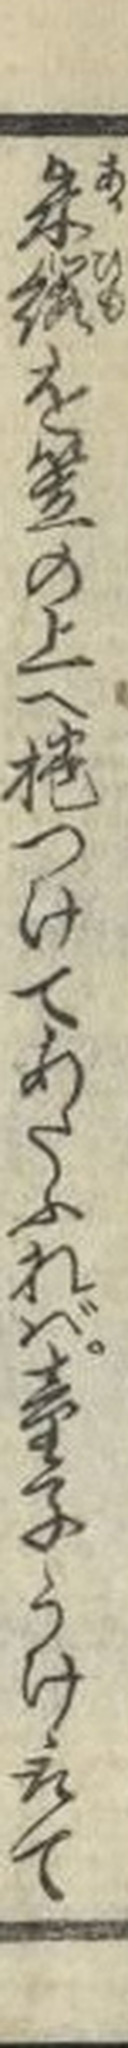朱纓を笠の上へ捲つけてあたふれば。童子うけ取て
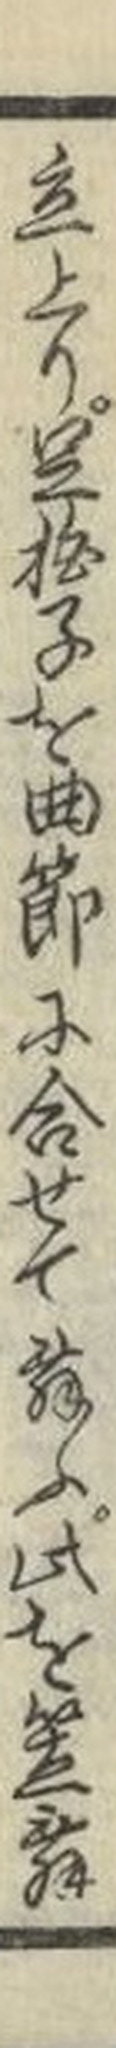立上り。足様子を曲節に合せて舞ふ。此を笠舞
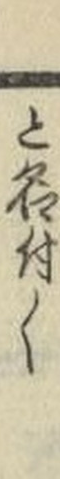と名付く
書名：琉球解語
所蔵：University of the Ryukyus Library
